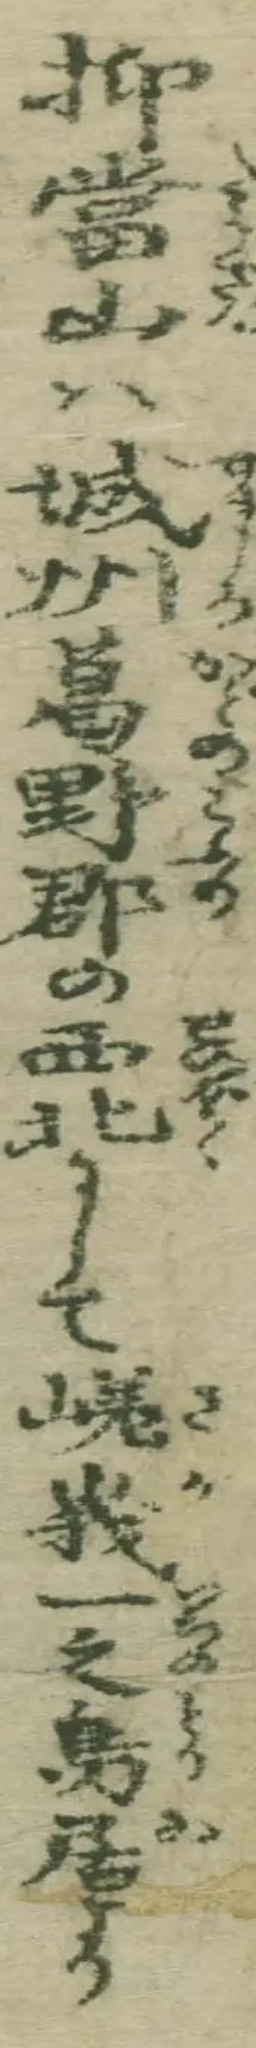抑當山は城州葛野郡の西北にして嵯峩一之鳥居より
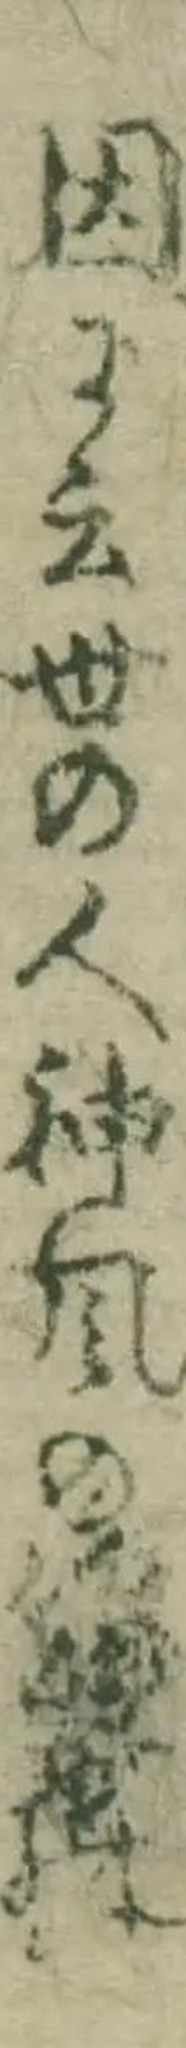因に云世の人神風の伊勢の
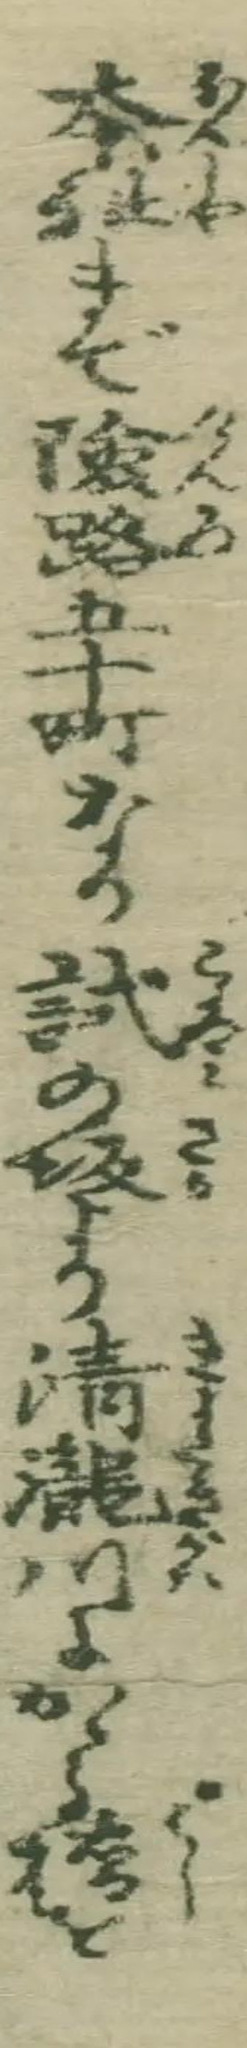本社まで険路五十町なり試の坂より清瀧川にかゝる橋を
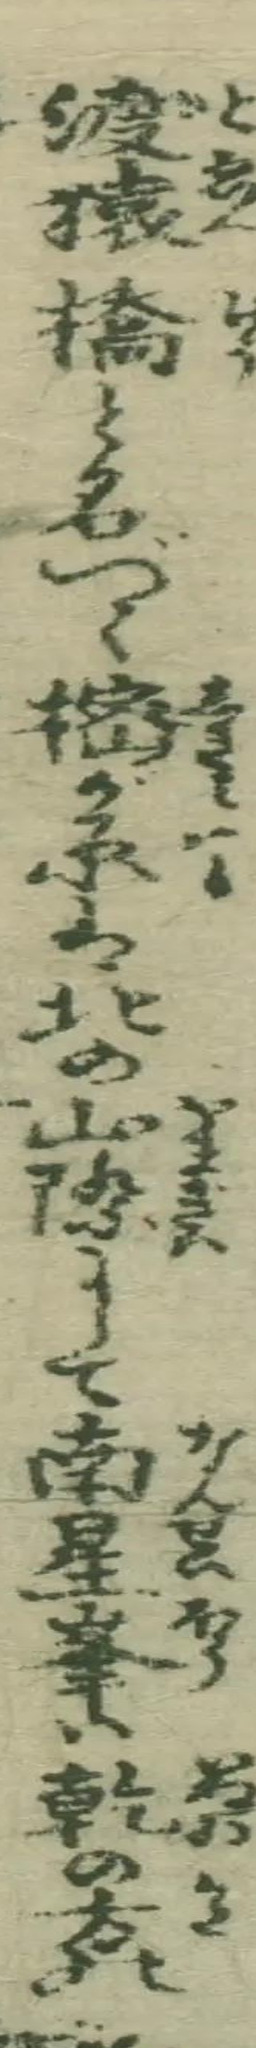渡猿橋と名づく樒が原は北の山際にして南星峯は乾の方の
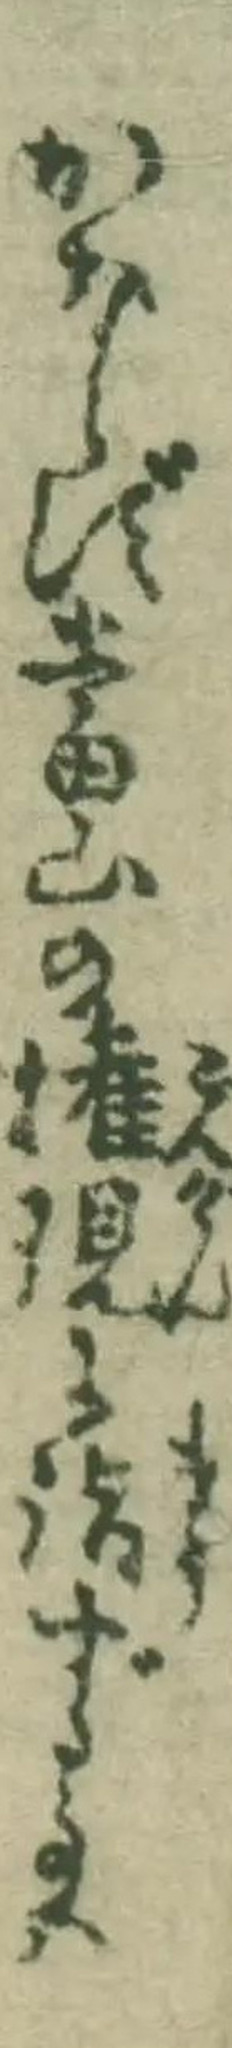かならず當山の権現に詣ずる事は
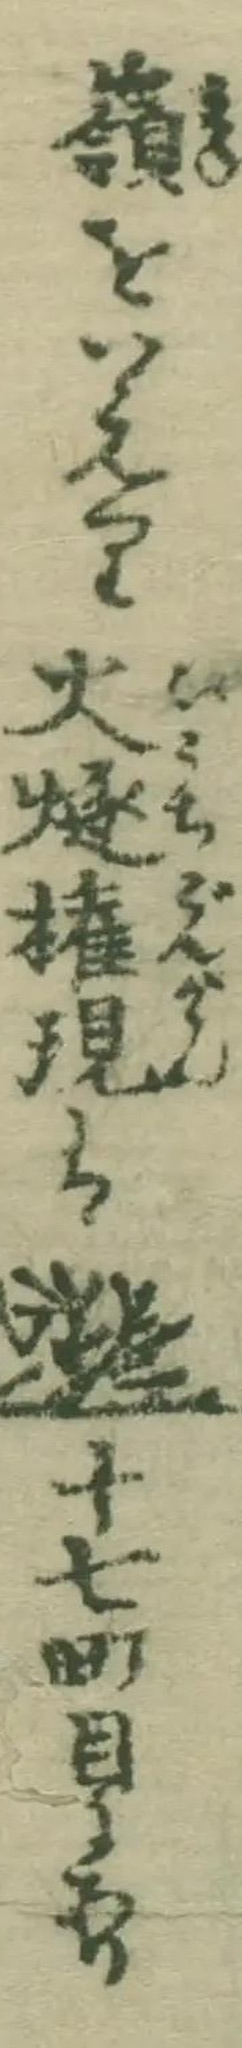嶺をいえり火燧権現は十七町目にあり
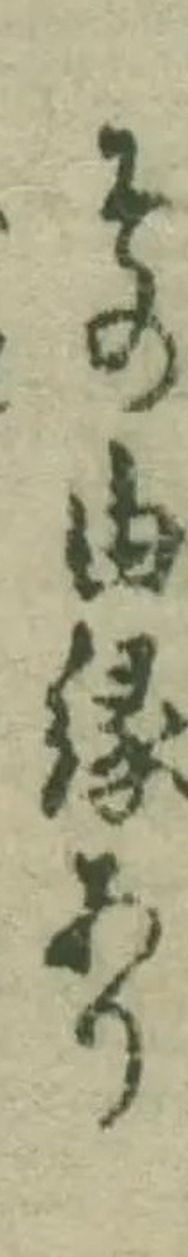その由縁あり
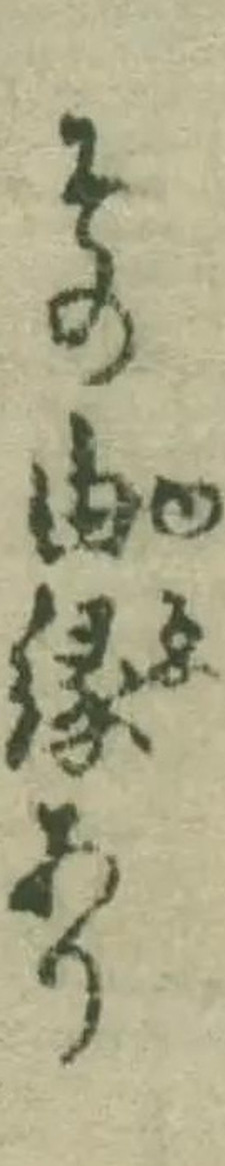その由縁あり
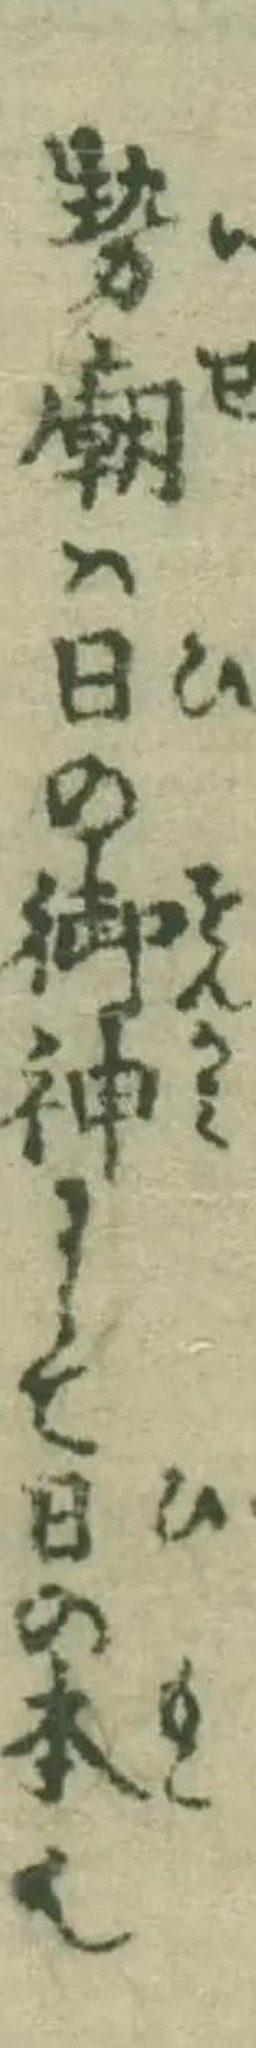勢廟は日の御神にして日の本也
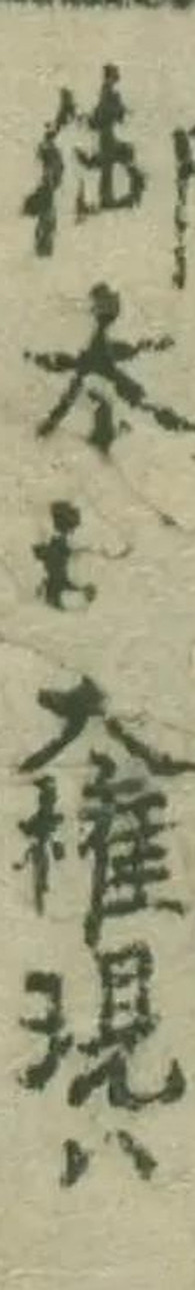御本社大権現は
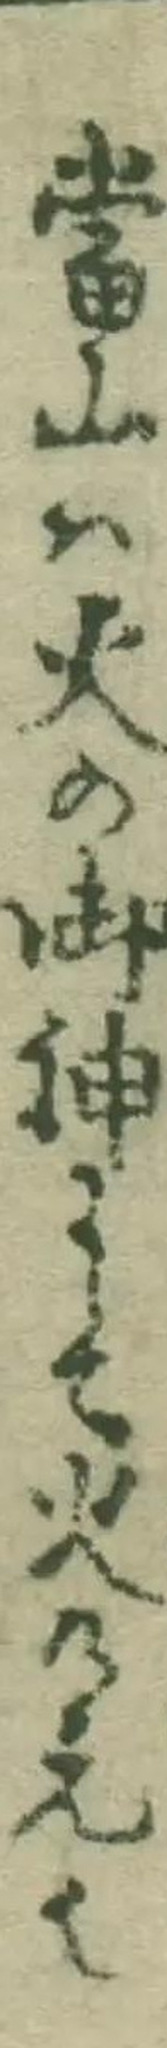當山は火の御神にして火の元也
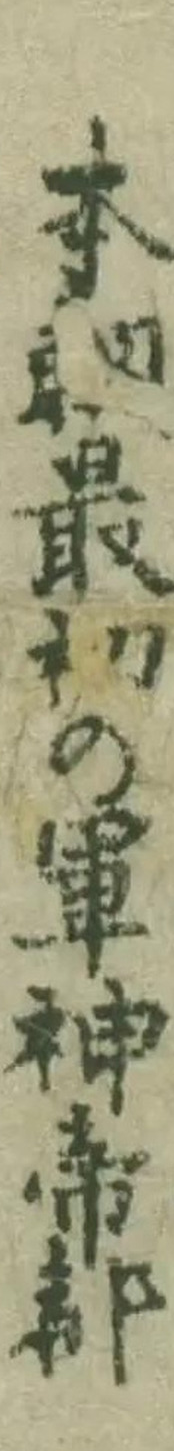本朝最初の軍神帝都
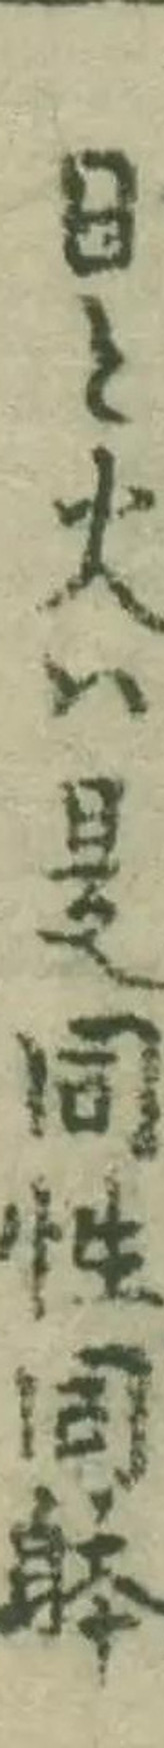日と火は是同性同体
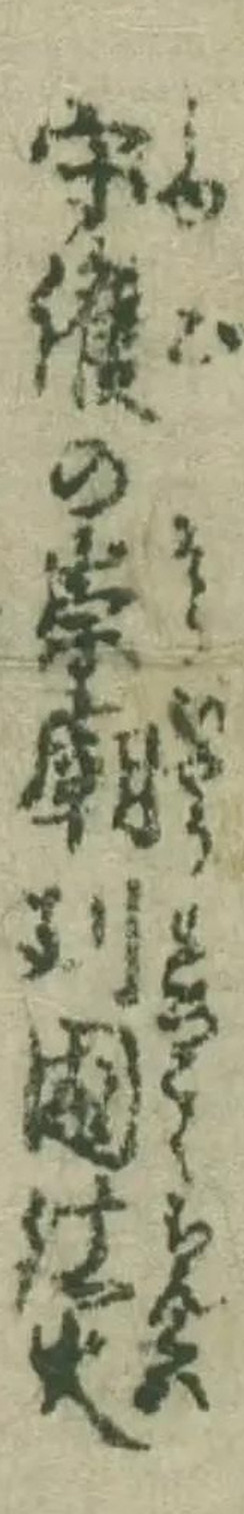守護の崇廟列国鎮火
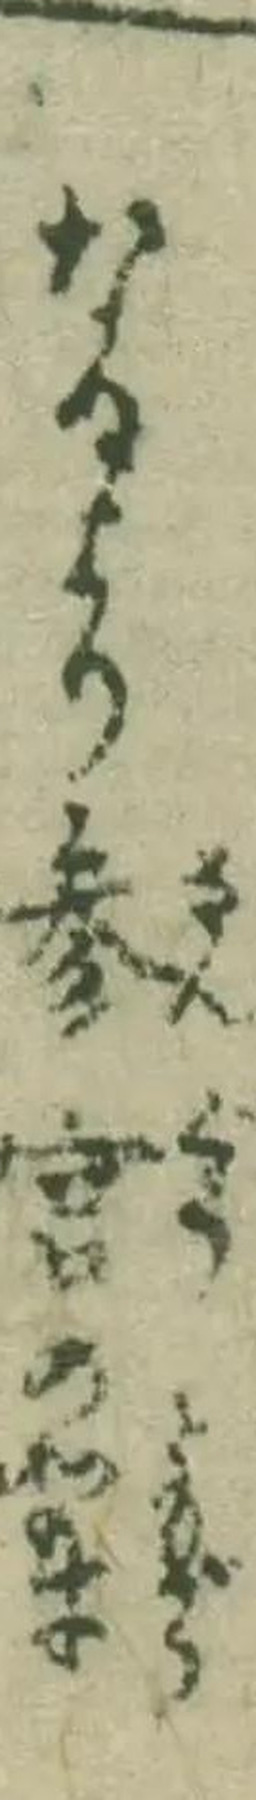なるより参宮の輩
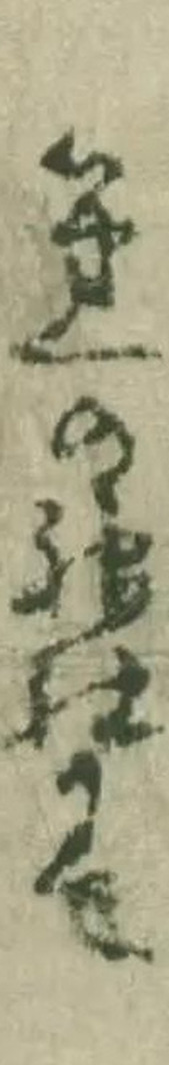第一の神社にて
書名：信濃國六郡大地震滿水之圖
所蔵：国立国会図書館 National Diet Library, JAPAN
